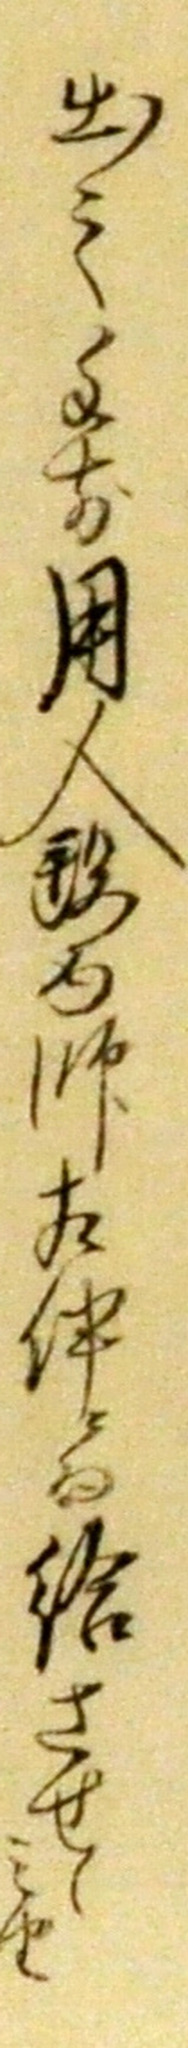出之手前用人医師相伴に而給させ候之由
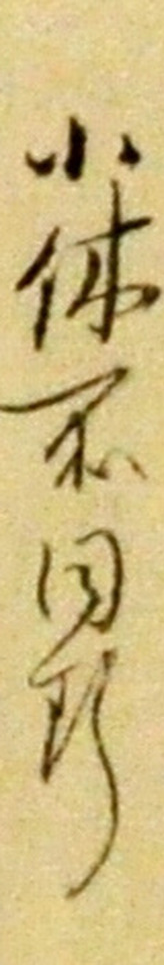小休所同断
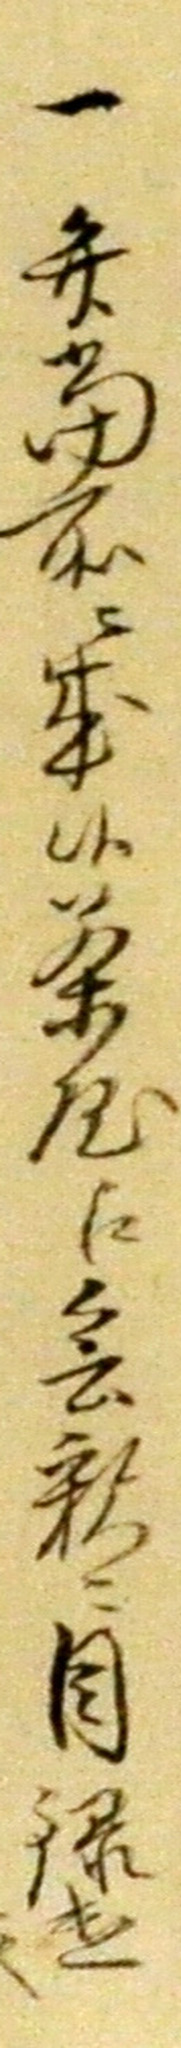一弁当所に来候茶屋え会釈に目録遣之
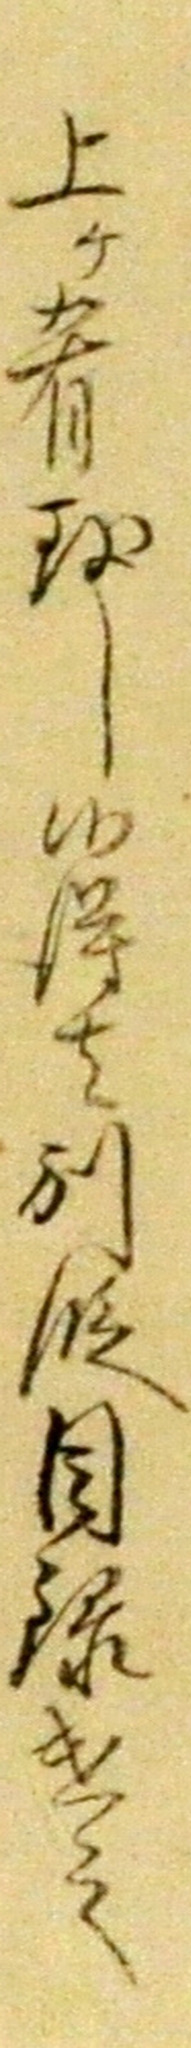上ケ肴致し候得は別段目録遣之
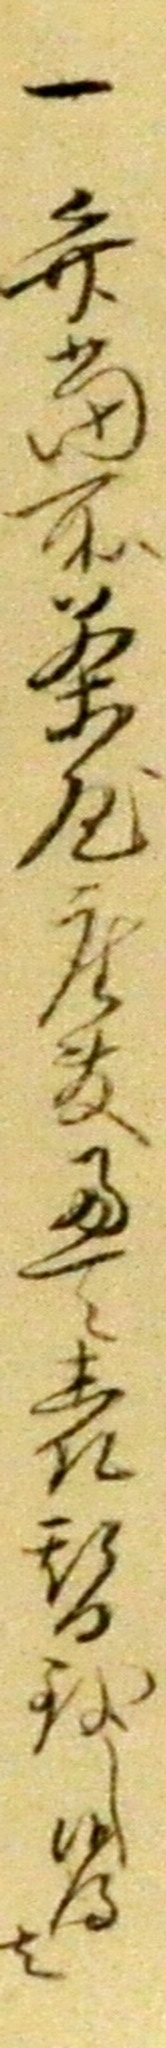一弁当所茶屋座敷畳表替致し候得は
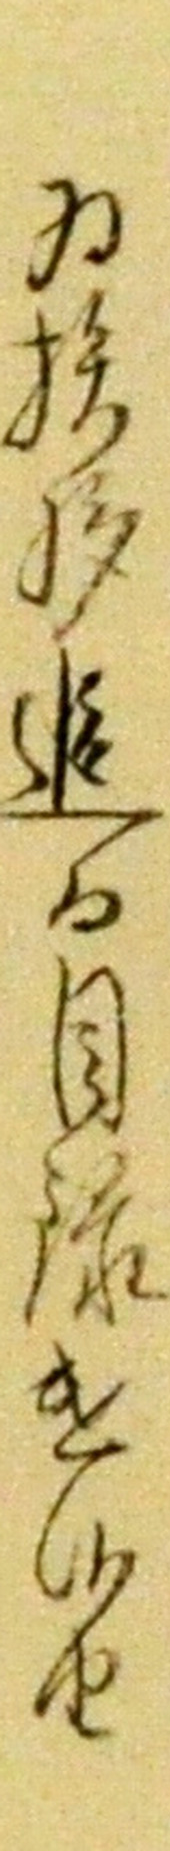為挨拶追而目録遣候由
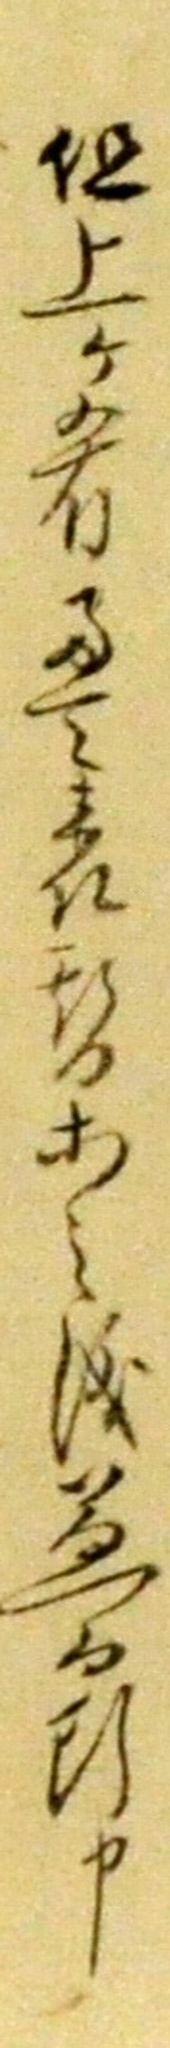但上ケ肴畳表替等之儀兼而断申
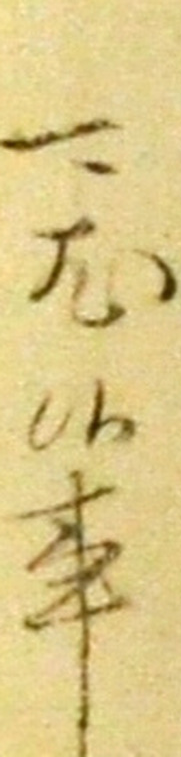可尤候事

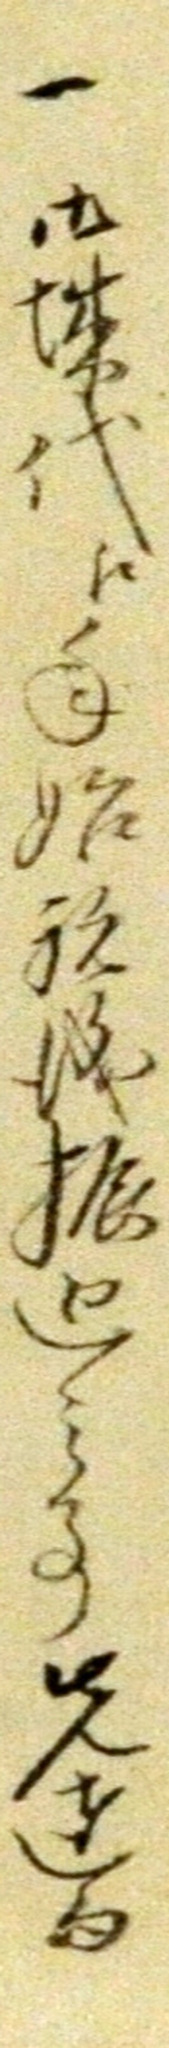一御城代江年始祝儀振廻之事先達而
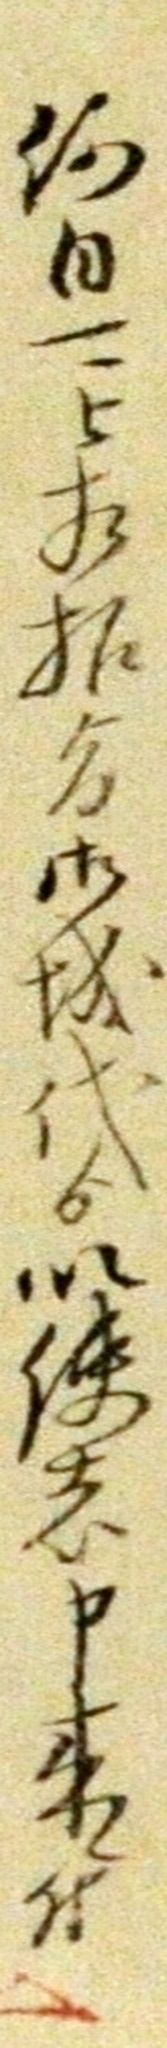何日可被相招旨御城代ゟ以使者申来候付
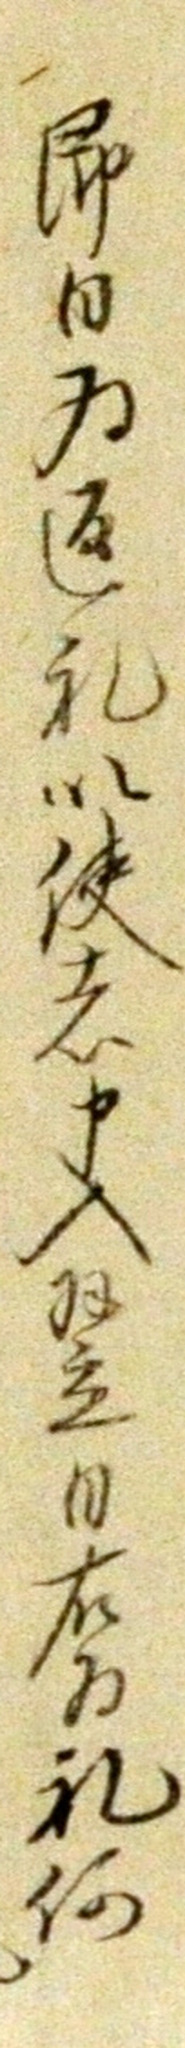即日為返礼以使者申入翌日右為礼何も
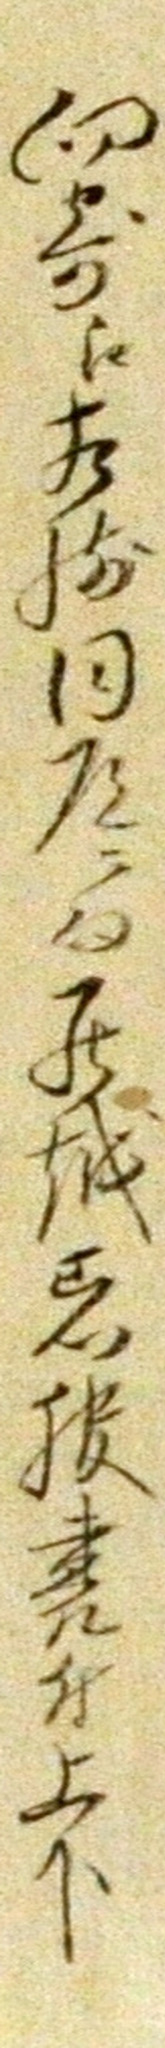向寄江相揃同道ニ而罷越着服裏付上下
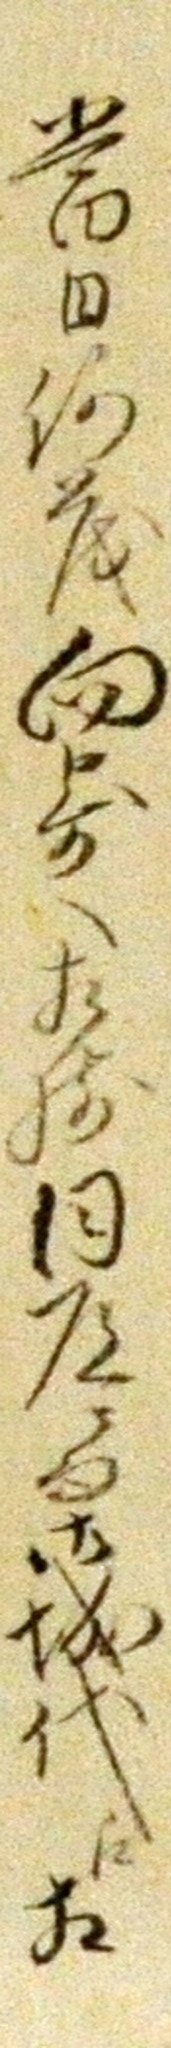当日何茂向寄へ相揃同道ニ而御城代江相
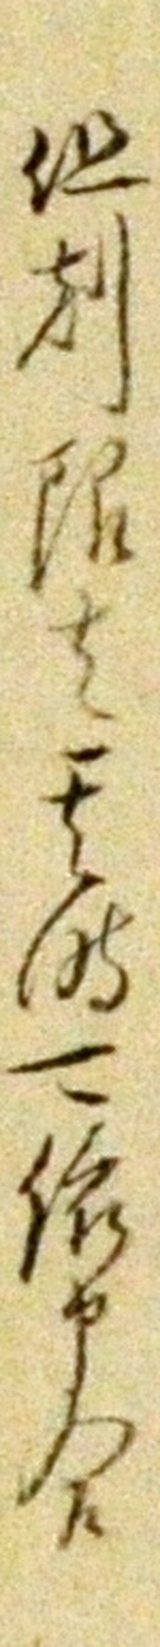但刻限者其時可依申合
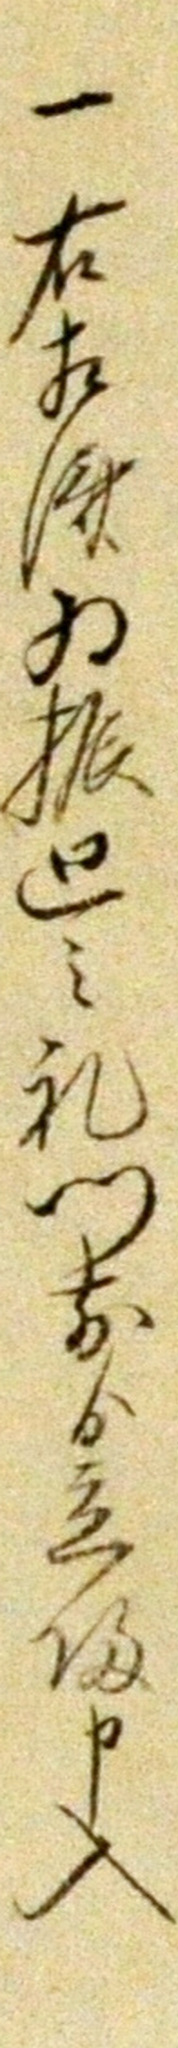一右相済為振廻之礼門前ゟ立帰申入
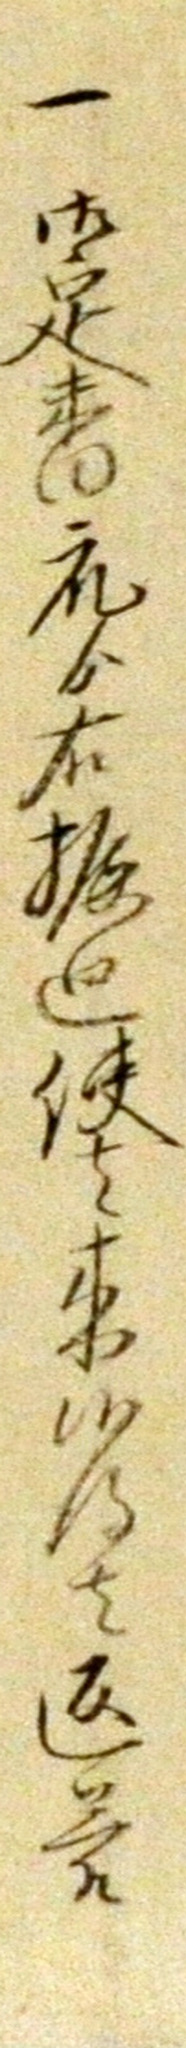一御定番衆ゟ右振廻使者来候得者返答
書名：大阪加番関係諸書留〔一括〕
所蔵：伊那市立高遠町図書館・合同会社AMANE
